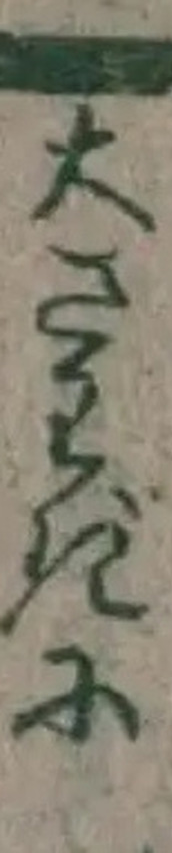大さわぎに
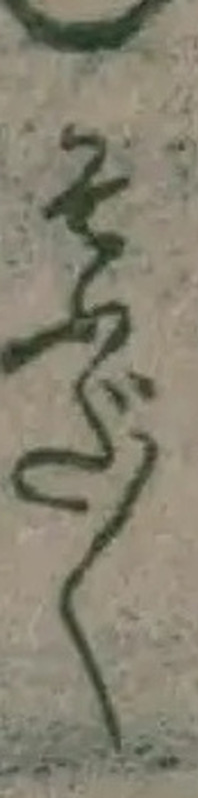そうだ〳〵
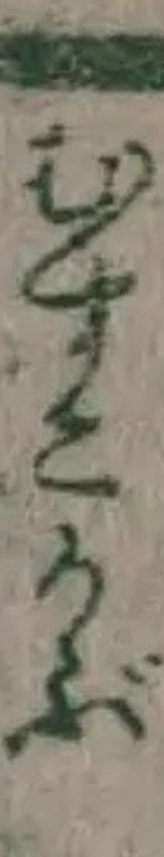むすこかぶ
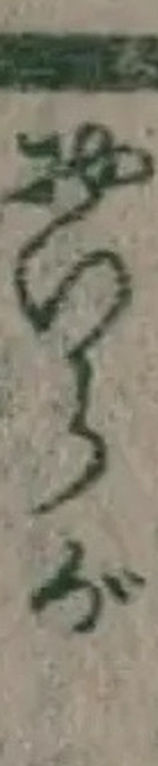おいらが
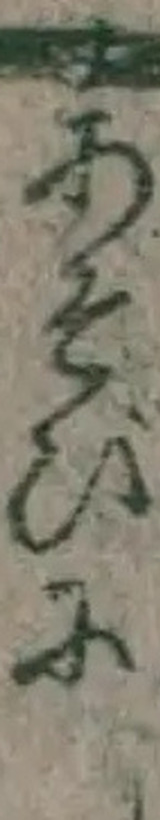あそびに
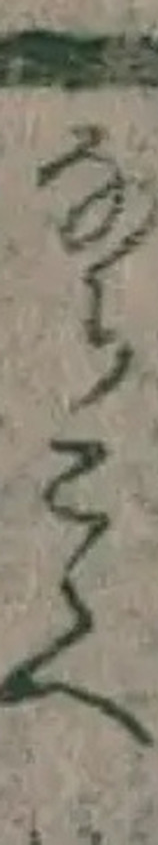ならこゝへ
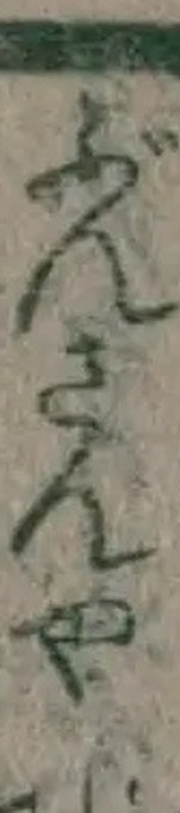ぶんさんや
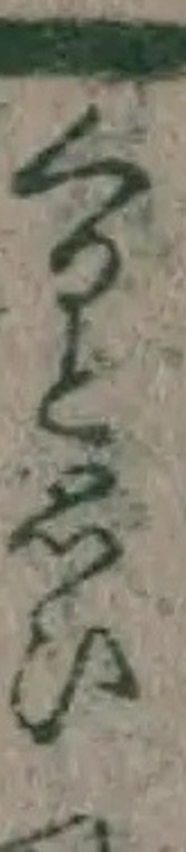くると思ひ
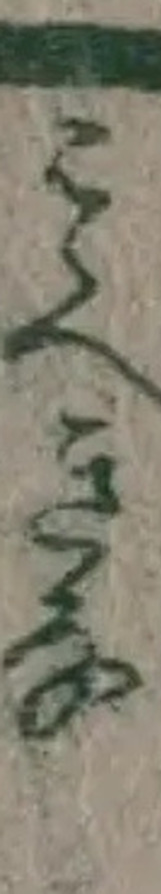こゝへきな
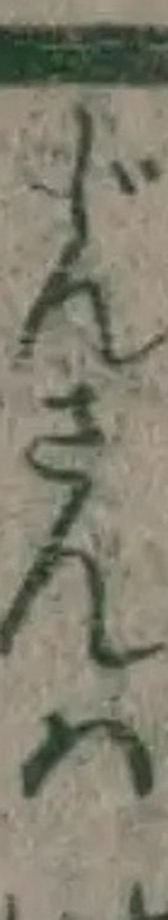じんさんは
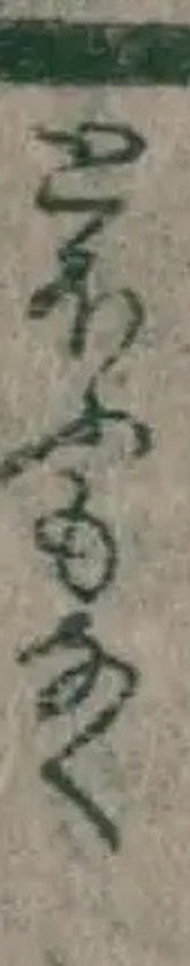とほふもなく
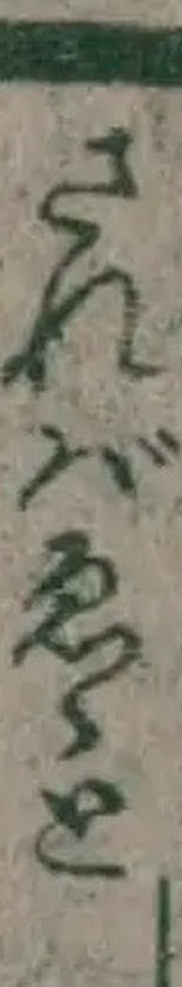さればゑゝと
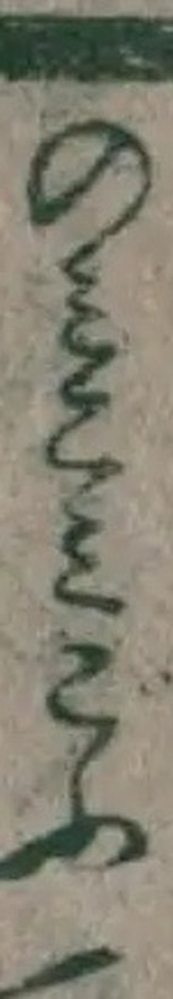のみこみごふ
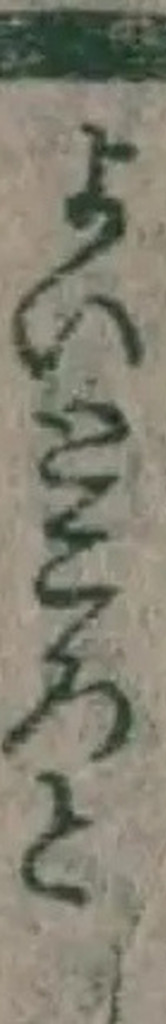よいところと
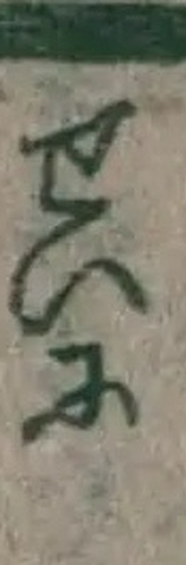せいに
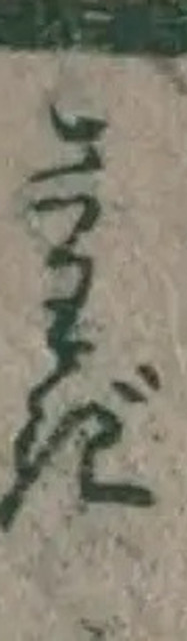さわぎ
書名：縦筒放唐の噺 3巻
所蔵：国立国会図書館 National Diet Library, JAPAN
